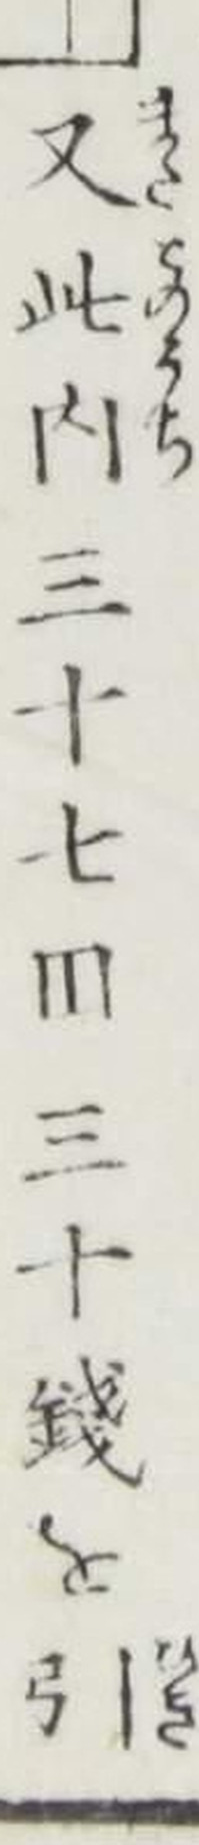又此内三十七円三十銭を引
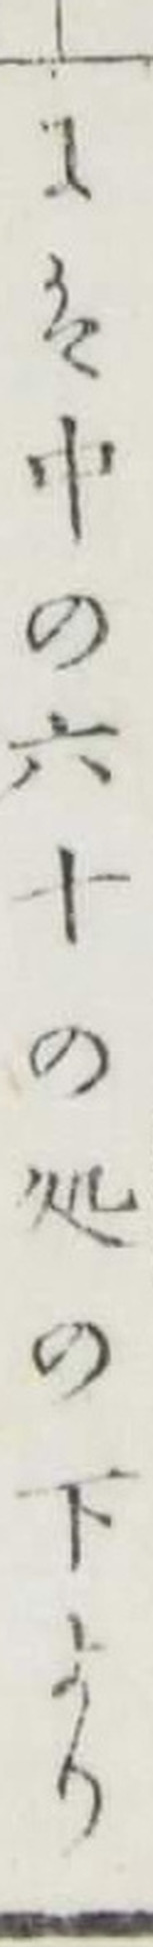には中の六十の処の下より
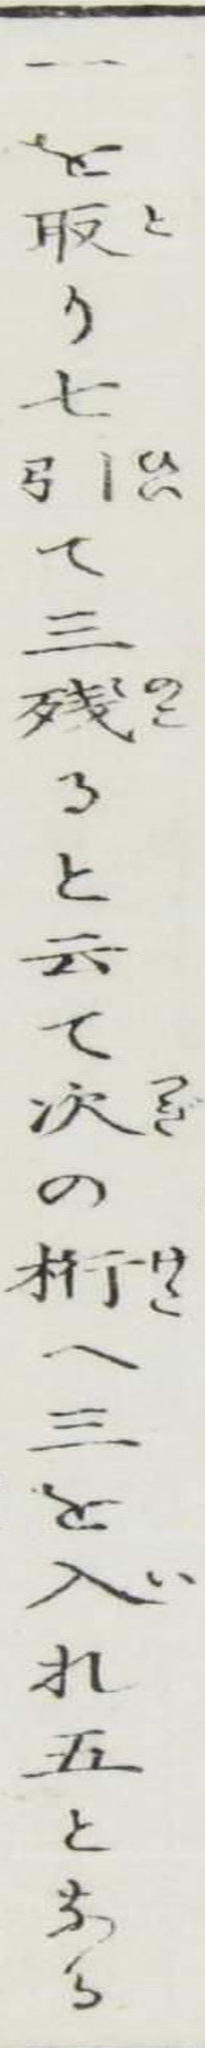一を取り七引て三残ると云て次の桁へ三を入れ五となる
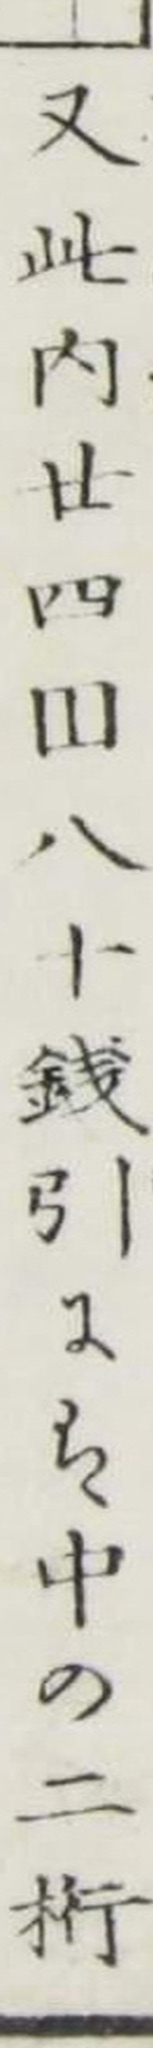又此内廿四円八十銭引には中の二桁
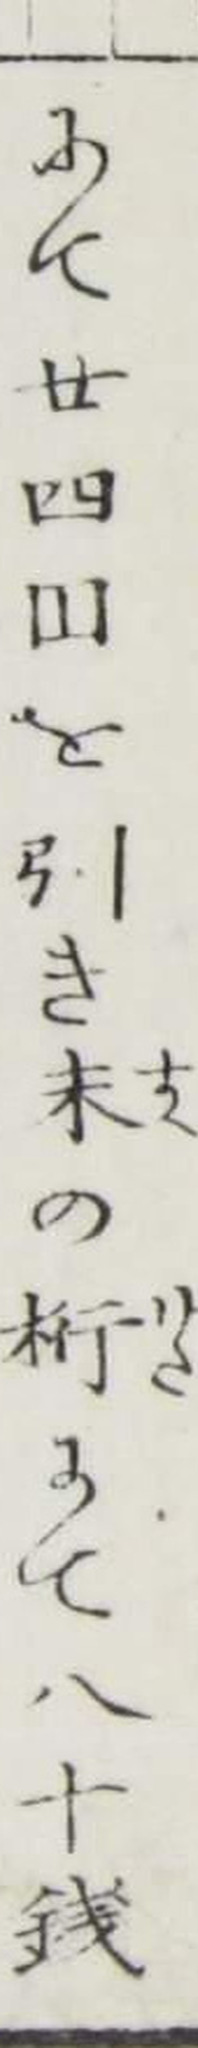にて廿四円を引き末の桁にて八十銭
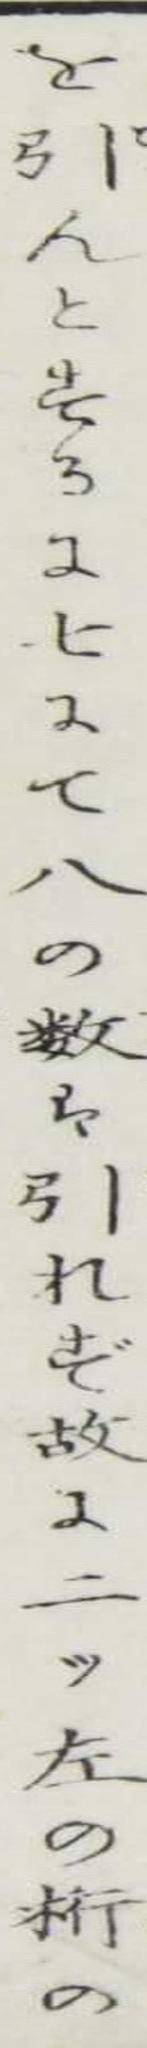を引んとするに七にて八の数は引れず故に二ッ左の桁の
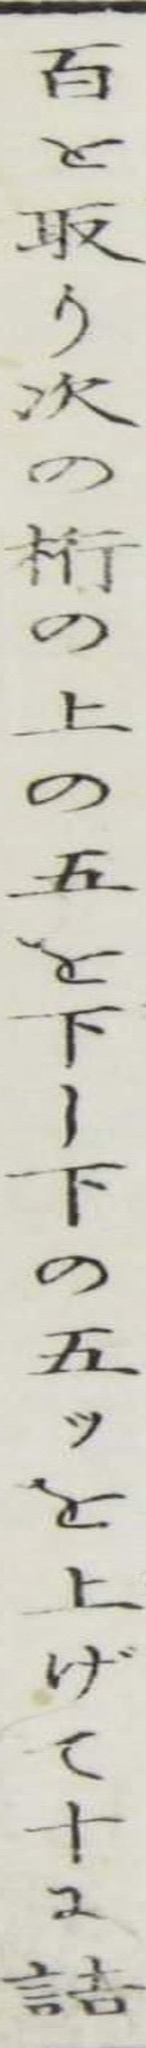百を取り次の桁の上の五を下し下の五ッを上げて十に詰
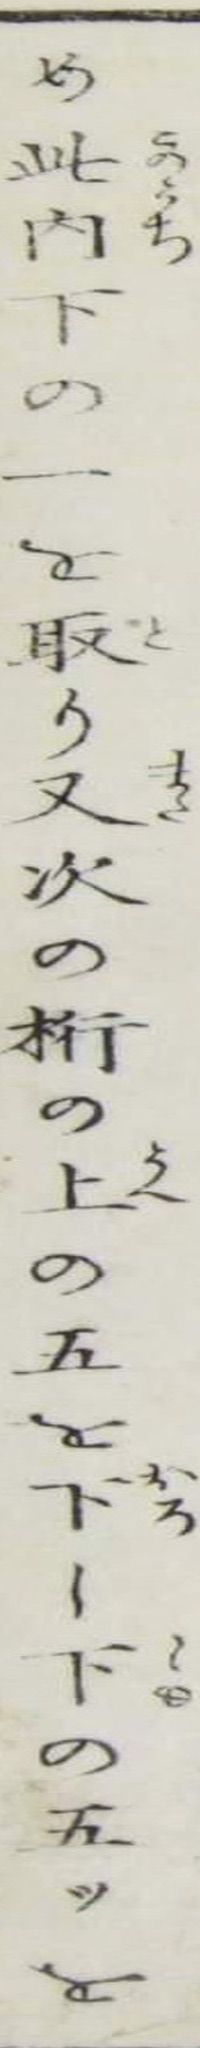め此内下の一を取り又次の桁の上の五を下し下の五ッを

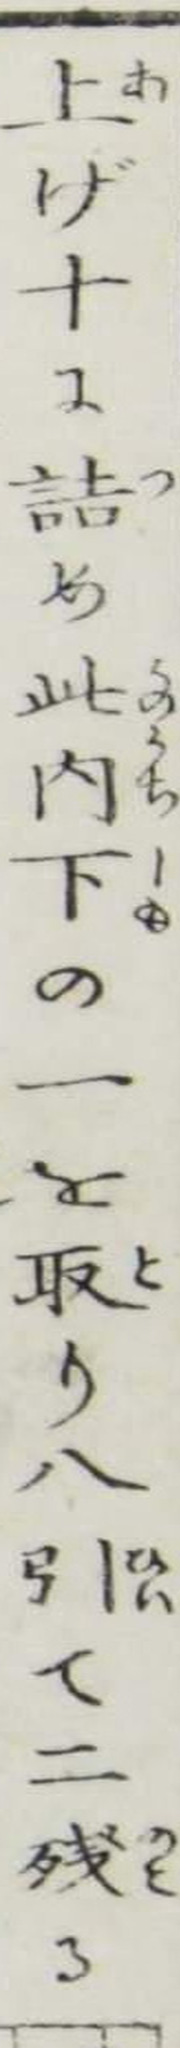上げ十に詰め此内下の一を取り八引て二残る
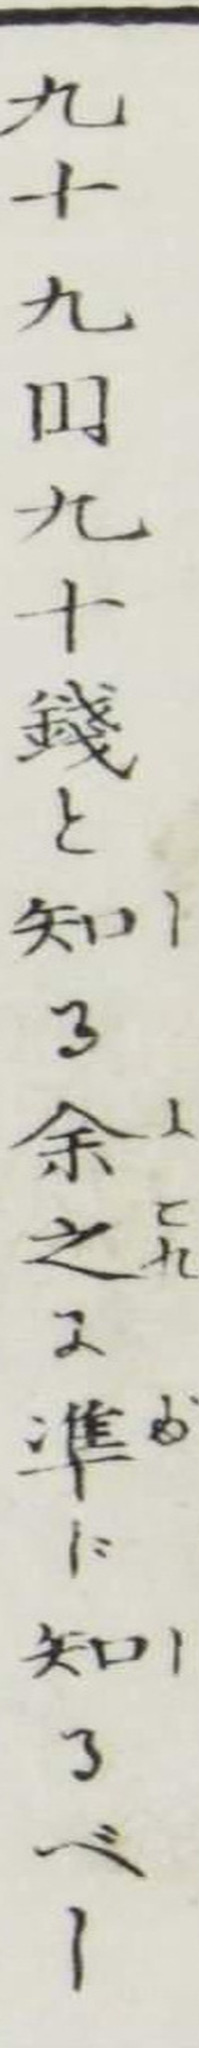九十九円九十銭と知る余之に準じ知るべし
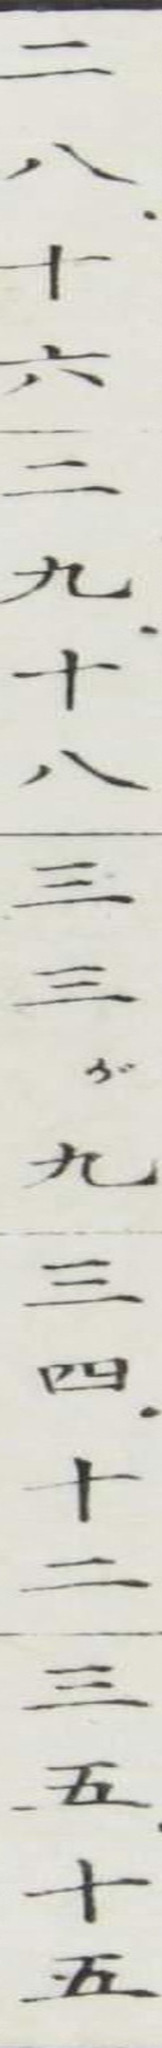二八．十六二九．十八三三．が九三四．十二三五．十五
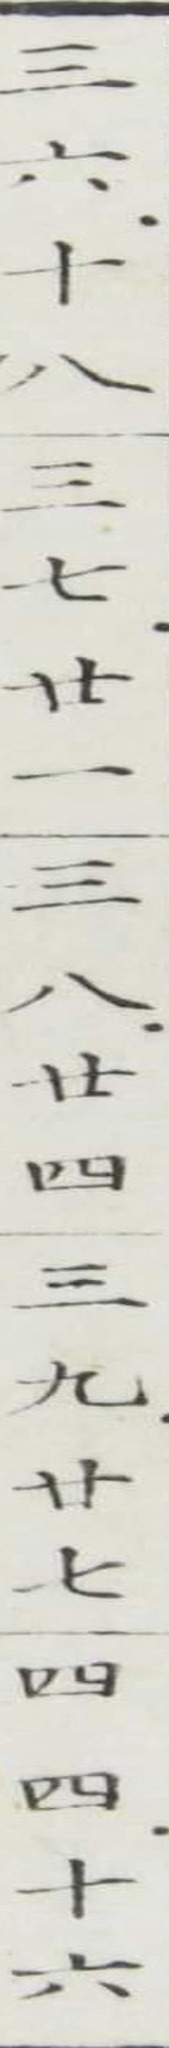三六．十八三七．廿一三八．廿四三九．廿七四四．十六
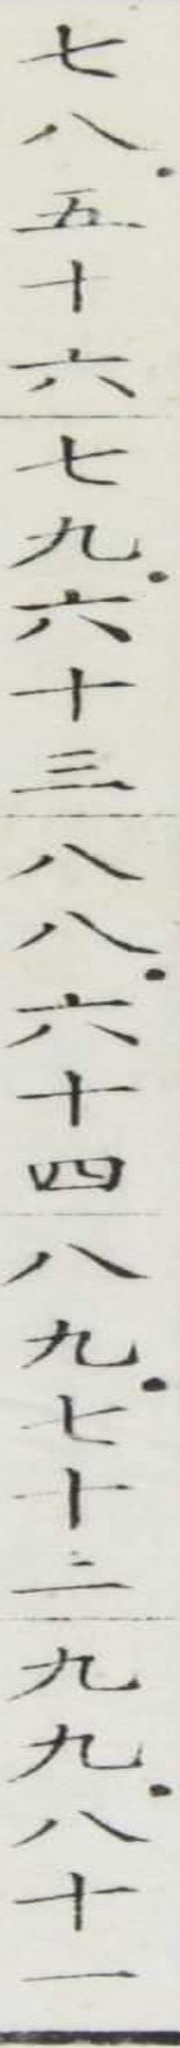七八．五十六七九．六十三八八．六十四八九．七十二九九．八十一
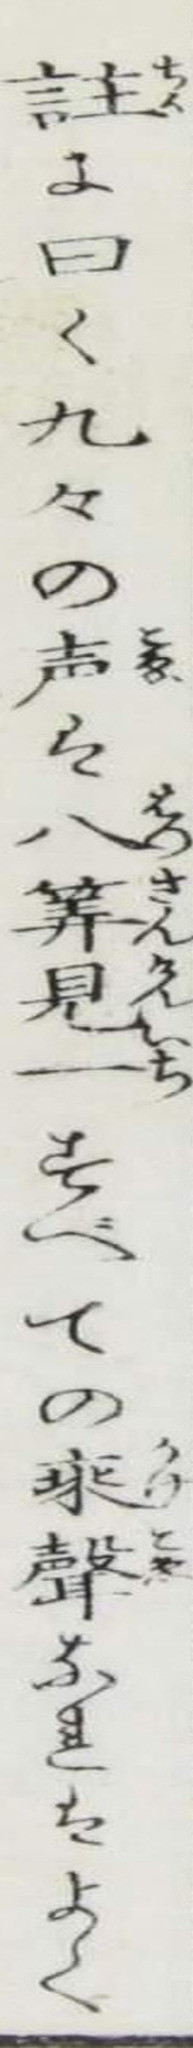註に曰く九々の声は八算見一すべての乗声なれはよく
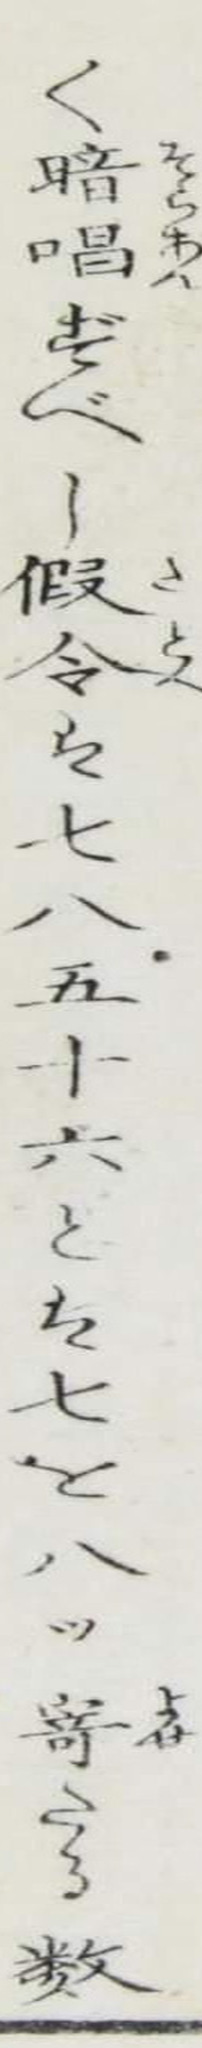く暗唱ずべし仮令は七八．五十六とは七を八ッ寄たる数
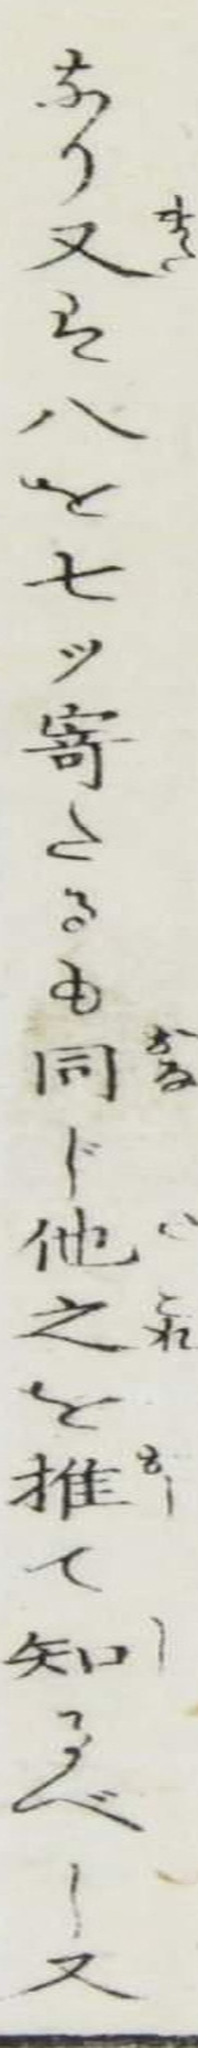なり又は八を七ッ寄たるも同じ他之を推て知るべし又
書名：明治小學塵劫記 卷1
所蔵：東京学芸大学教育コンテンツアーカイブ
